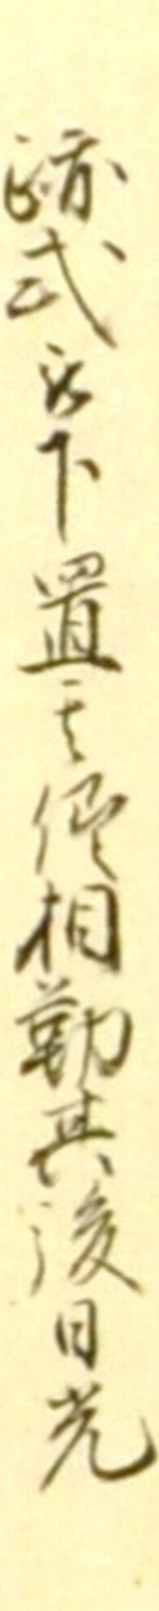跡式被下置其侭相勤其後日光
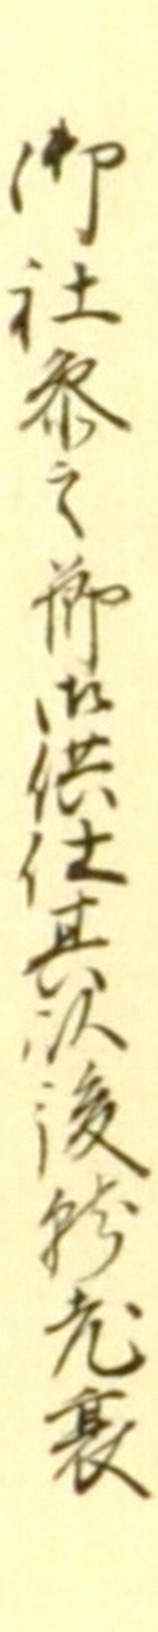御社参之節御供仕其以後就老衰
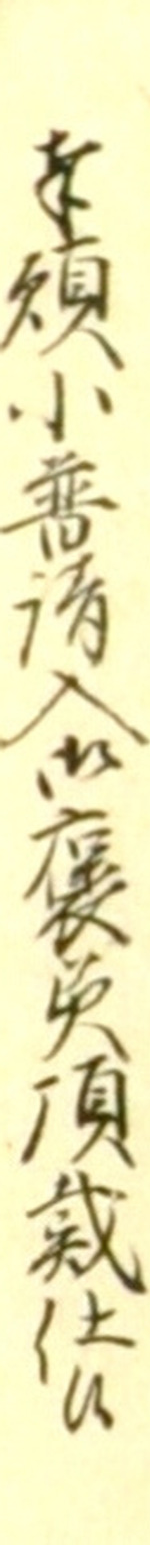奉願小普請入御褒美頂戴仕候

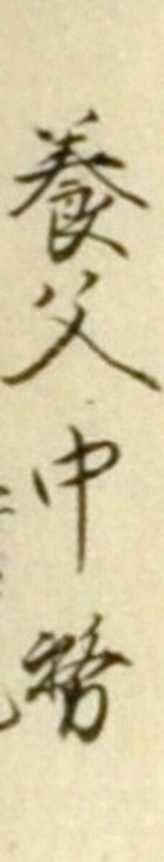養父中務
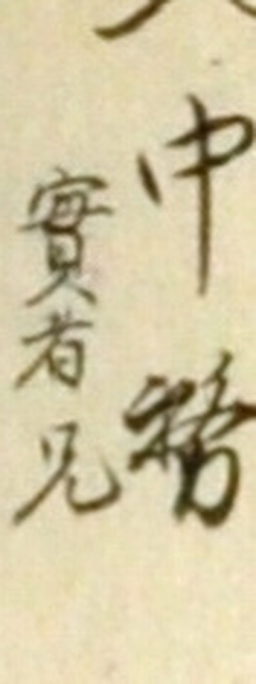實者兄
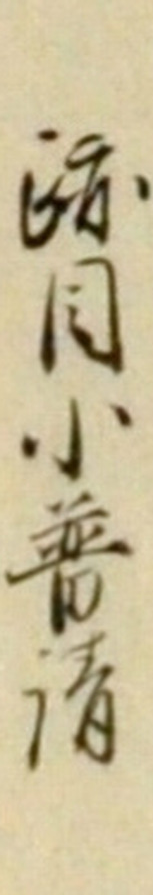跡目小普請
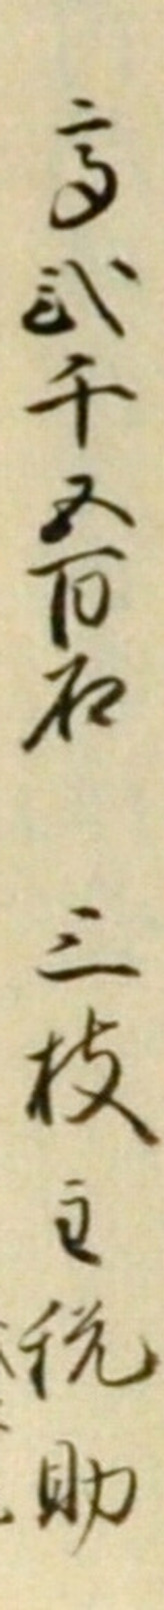高弐千五百石三枝主税助
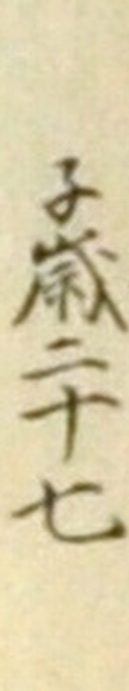子歳二十七
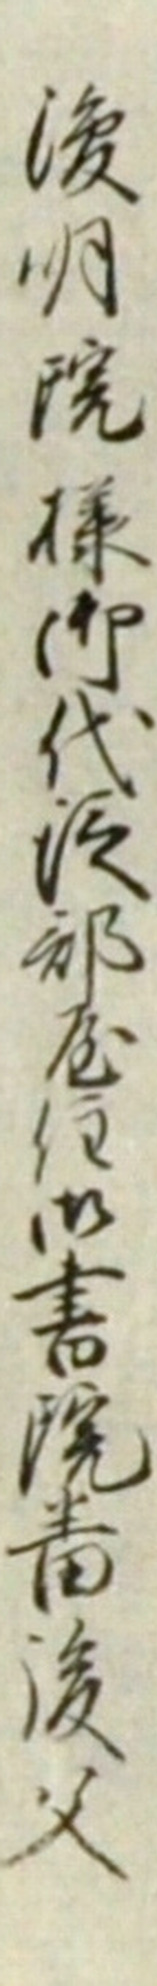浚明院様御代従部屋住御書院番後父
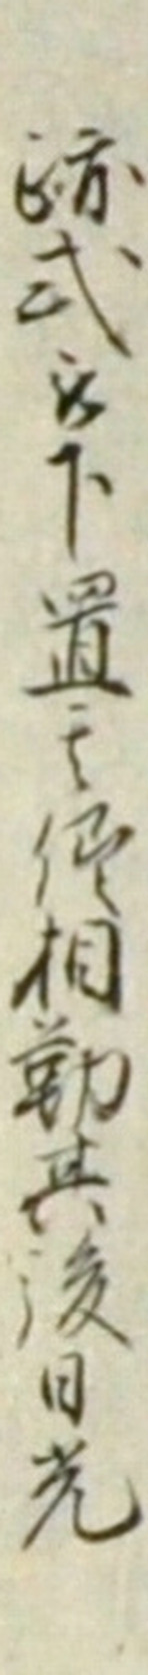跡式被下置其侭相勤其後日光
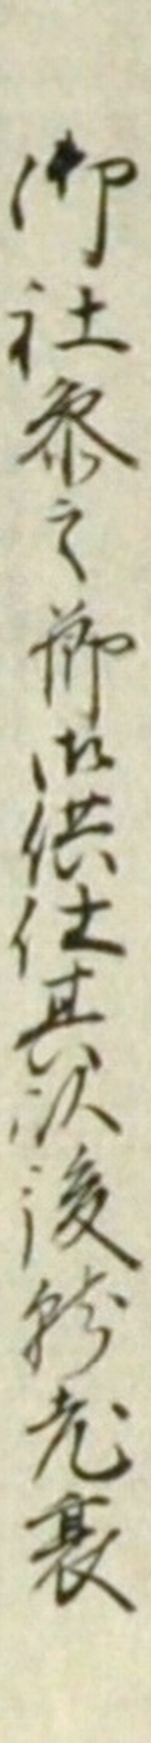御社参之節御供仕其以後就老衰
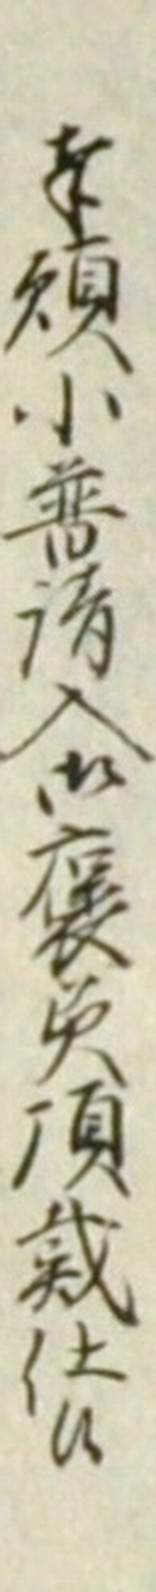奉願小普請入御褒美頂戴仕候
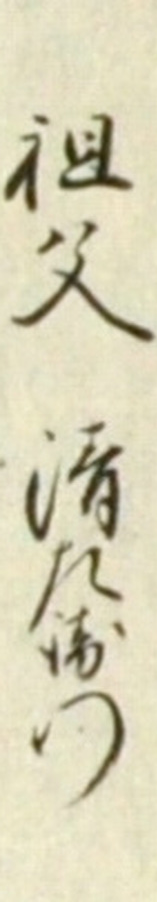祖父清左衛門
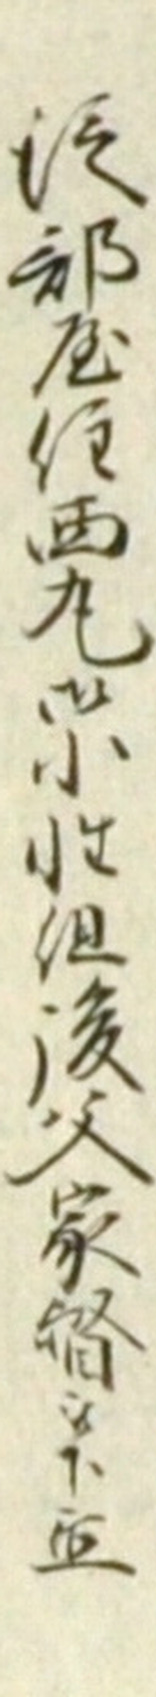従部屋住西丸御小姓組後父家督被下置
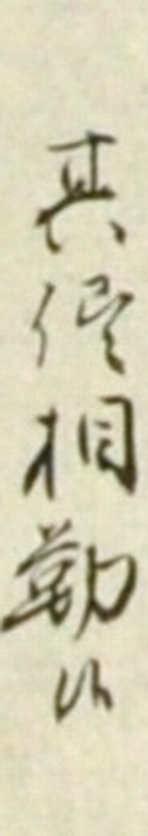其侭相勤候
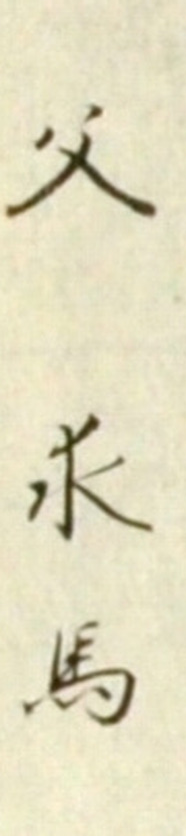父求馬
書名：若年寄御役中御調書付
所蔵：伊那市立高遠町図書館・合同会社AMANE
